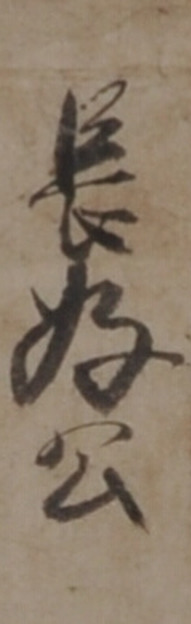長好公
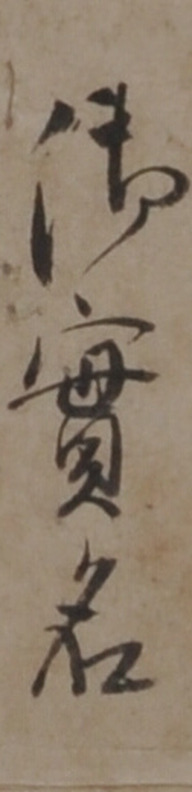御実名
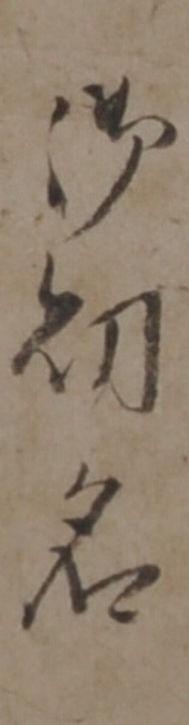御実名
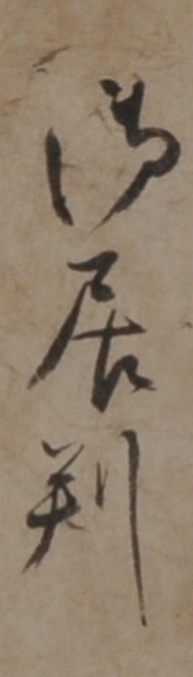御居判

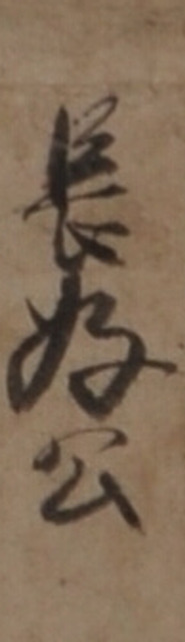長好公
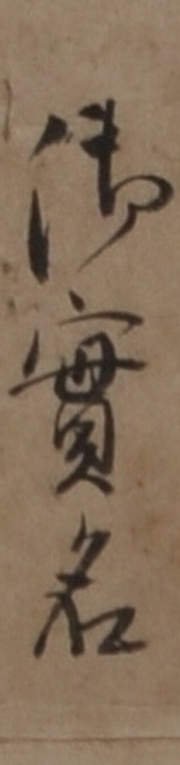御実名
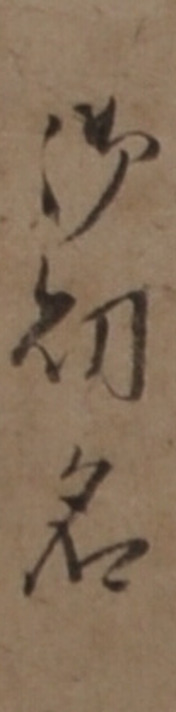御実名
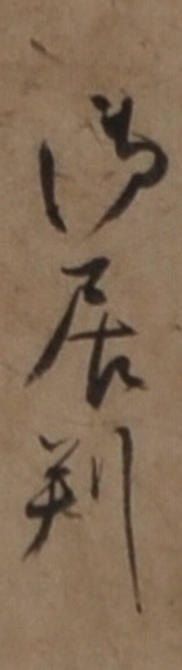御居判

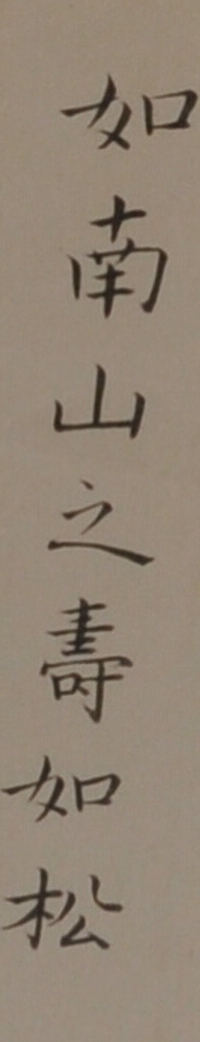如南山之寿如松
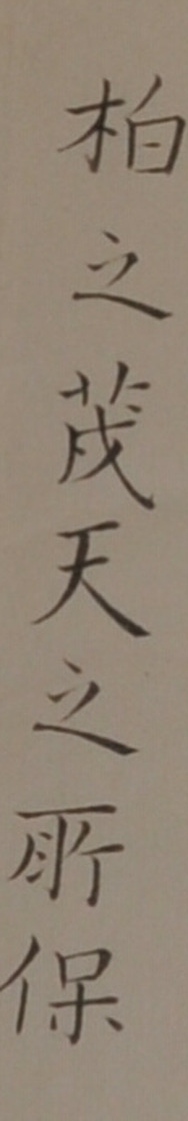柏之茂天之所保
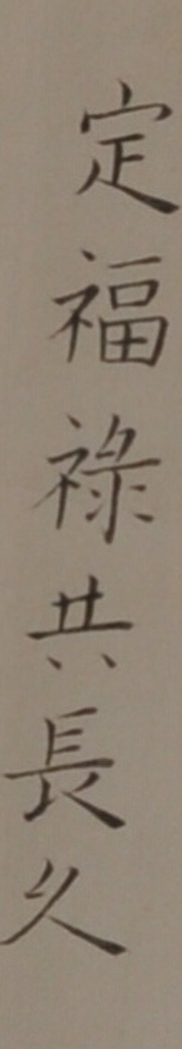定福禄共長久
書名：御諱
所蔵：伊那市立高遠町図書館・合同会社AMANE
